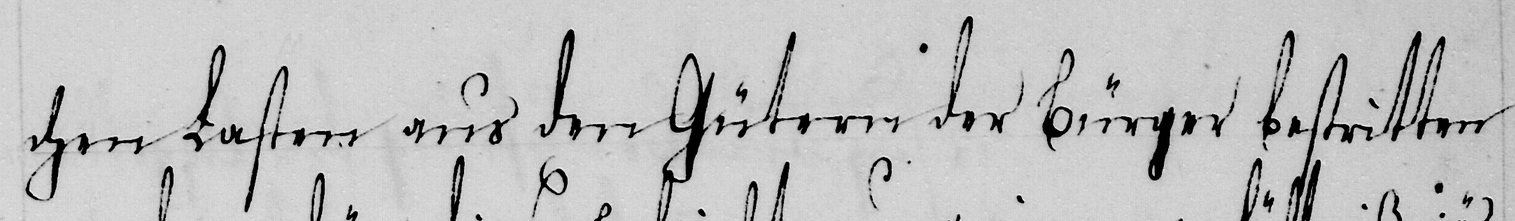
chen Lasten aus den Gütern der Bürger bestritten
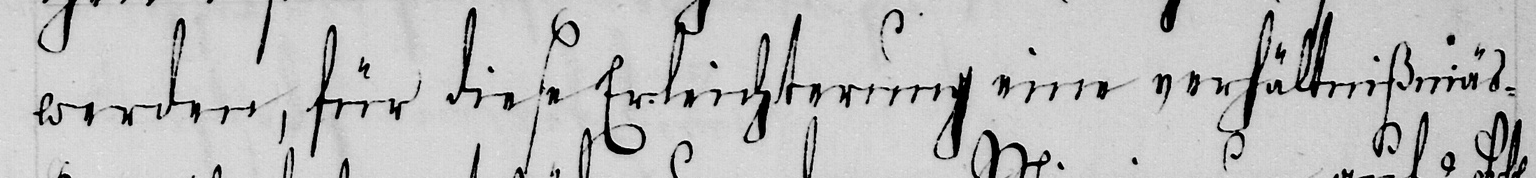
werden, für diese Erleichterung eine verhältnißmäß¬
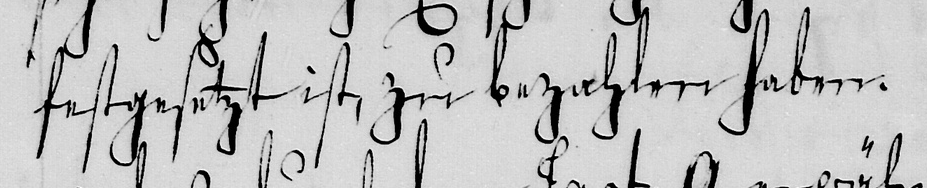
festgesetzt ist, zu bezahlen haben.
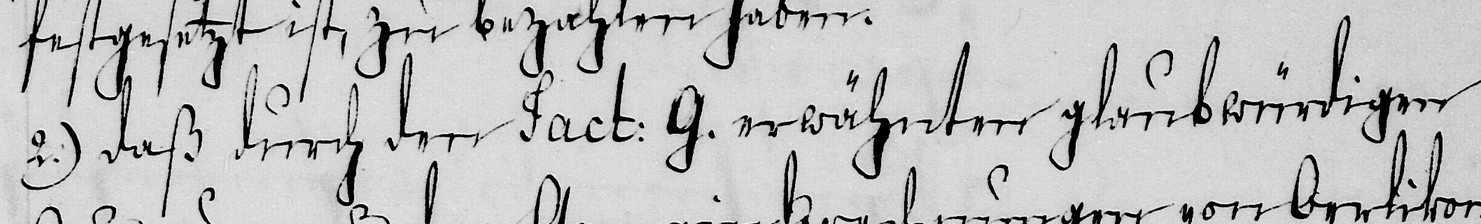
2.) daß durch den Fact: G. erwähnten glaubwürdigen
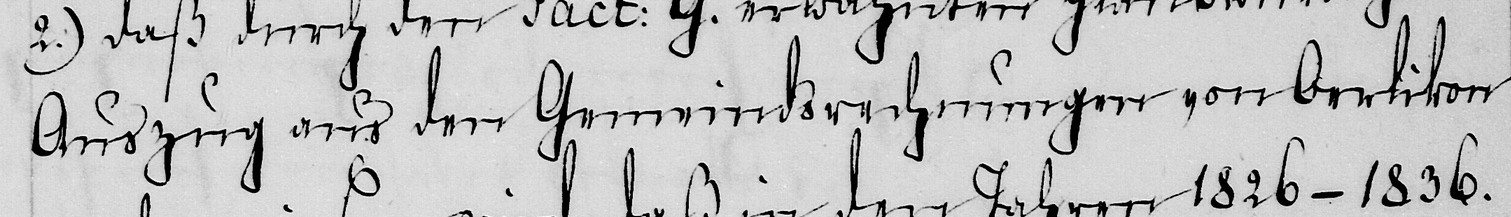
Auszug aus den Gemeindsrechnungen von Oerlikon
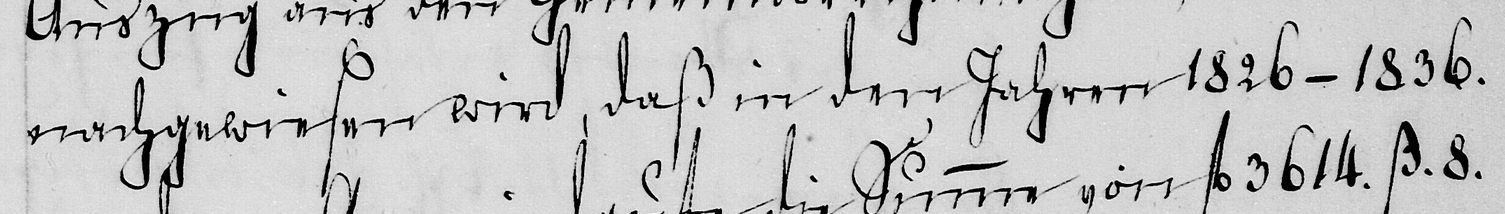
nachgewiesen wird, daß in den Jahren 1826–1836.
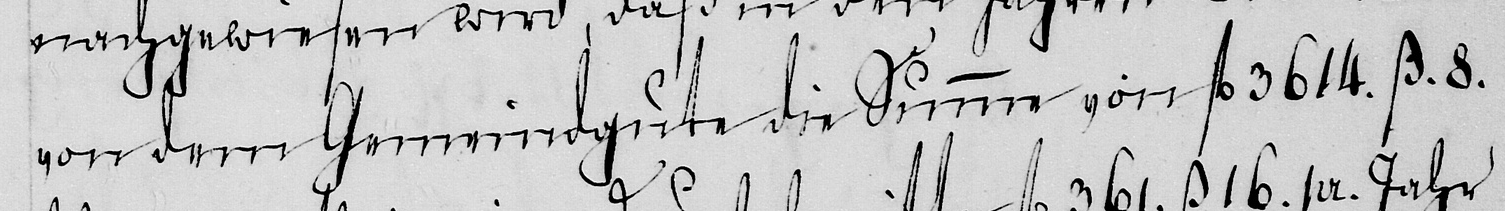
von dem Gemeindgute die Summe von fl. 3614. ß. 8.
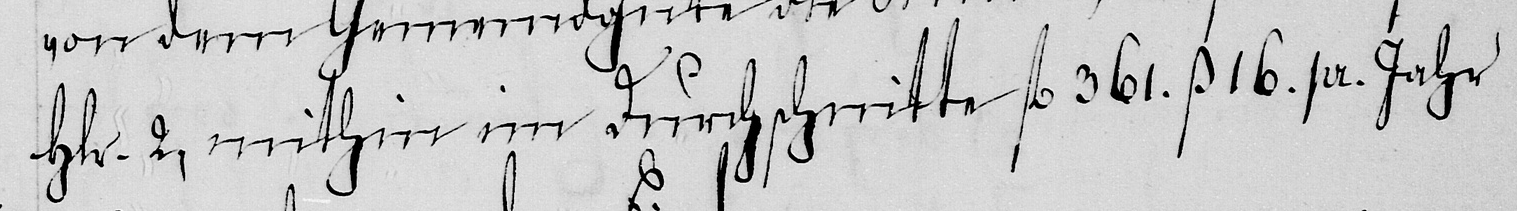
Hlr. 2, mithin im Durchschnitte fl. 361. ß. 16. pr. Jahr
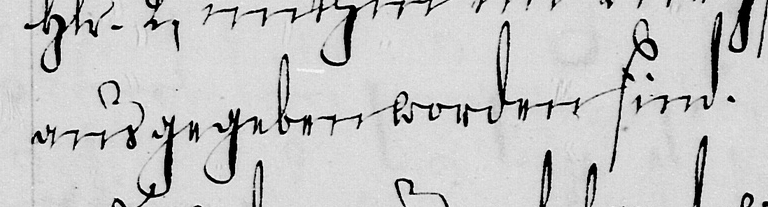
ausgegeben worden sind.
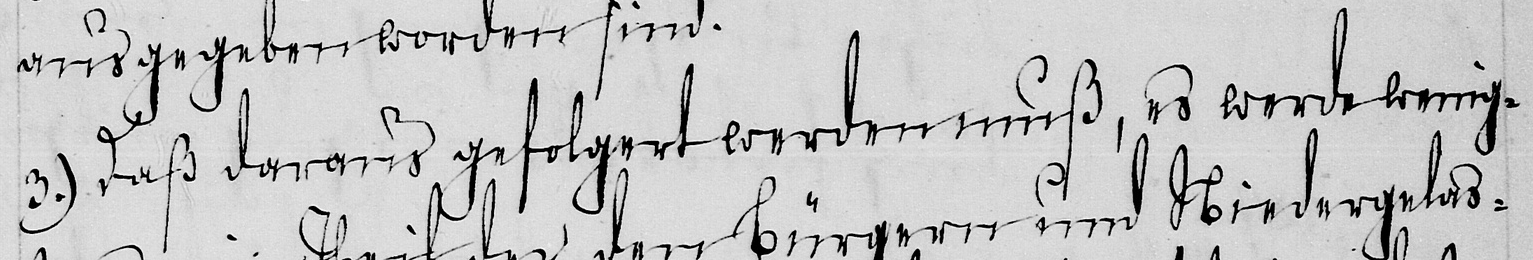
3.) Daß daraus gefolgert werden muß, es werde wenig¬
